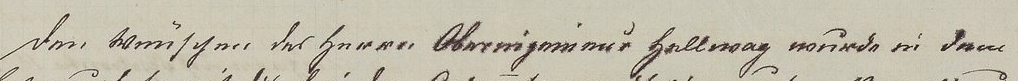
Den Wünschen des Herrn Oberingenieur Hellwag wurde in dem
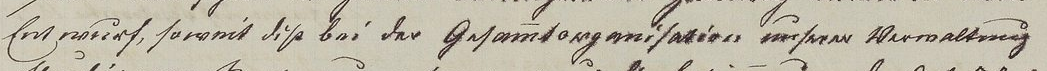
Entwurf, soweit diß bei der Gesammtorganisation unserer Verwaltung
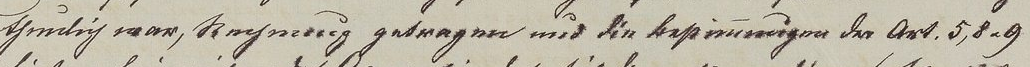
thunlich war, Rechnung getragen und die Bestimmungen der Art. 5, 8 & 9
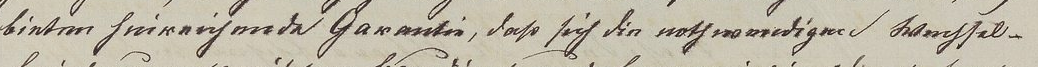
bieten hinreichende Garantie, daß sich die nothwendigen Wechsel-
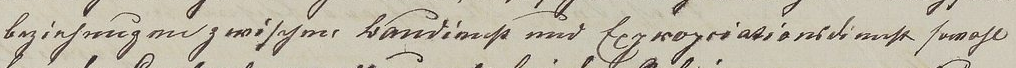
beziehungen zwischen Baudienst und Expropriationsdienst sowohl
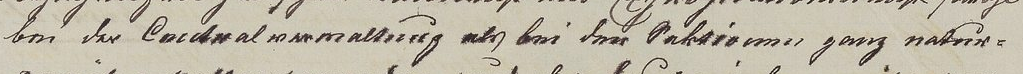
von der Centralverwaltung als bei den Sektionen ganz natur-
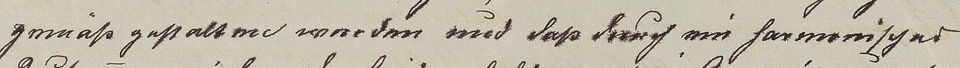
gemäß gestalten werden und daß durch ein harmonisches
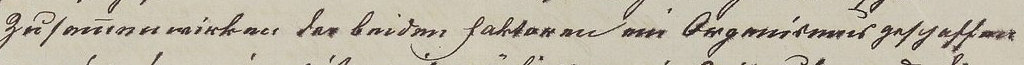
Zusammenwirken der beiden Faktoren ein Organismus geschaffen
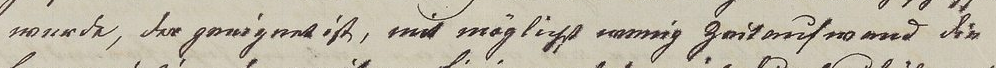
werde, der geeignet ist, mit möglichst wenig Zeitaufwand die
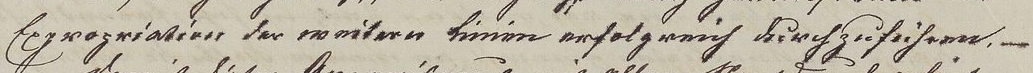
Expropriation der weitern Linien erfolgreich durchzuführen. –
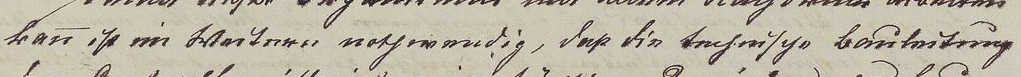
kann ist im Weitern nothwendig, daß die technische Bauleitung
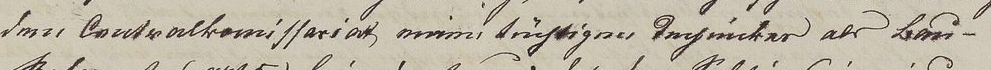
dem Centralkomissariat einen tüchtigen Techniker als Bau--
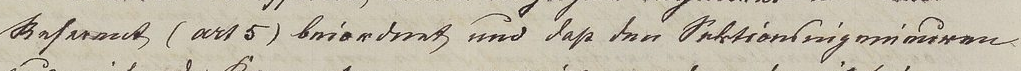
Referent (art 5) beiordnet und daß den Sektionsingenieuren
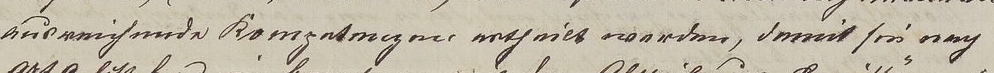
ausreichende Kompetenzen ertheilt werden, damit sie nach
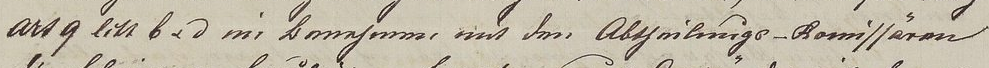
Art 9 litt b & d im Benehmen mit den Abtheilungs-Komissären
